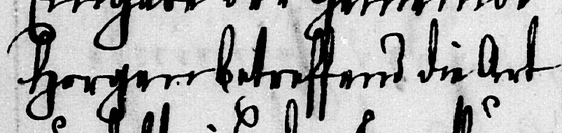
Horgen betreffend die Art
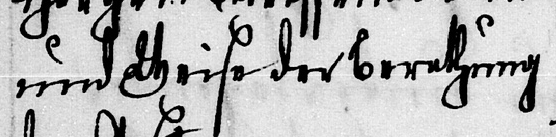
und Weise der Berathung
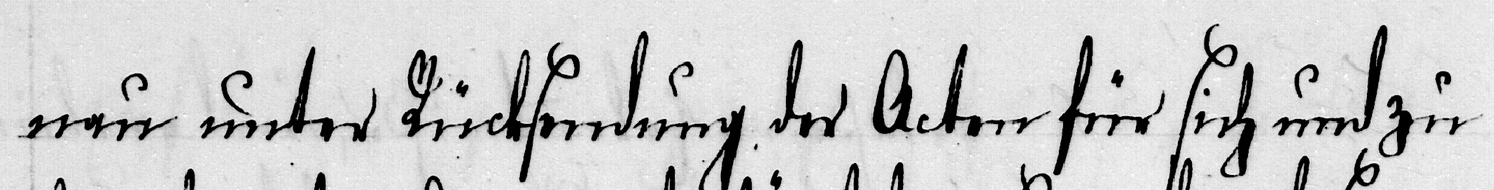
nau unter Rücksendung der Acten für sich und zu
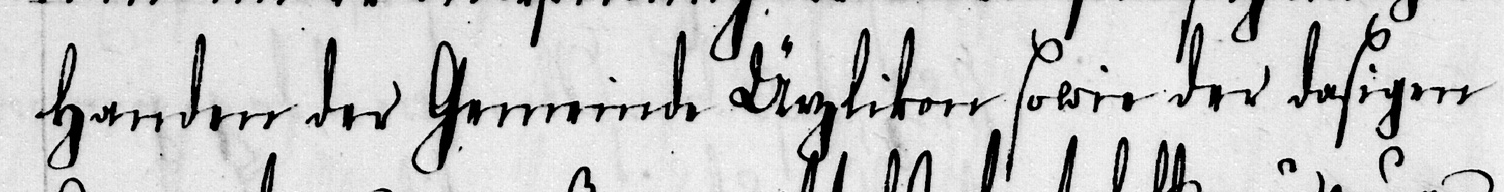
Handen der Gemeinde Ürzlikon sowie der dasigen
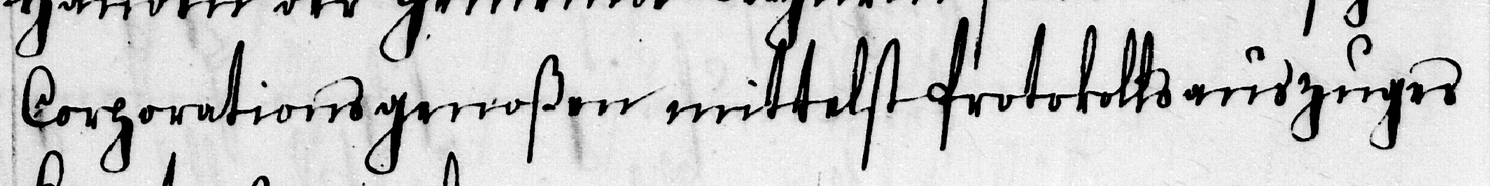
Corporationsgenoßen mittelst Protokollsauszuges
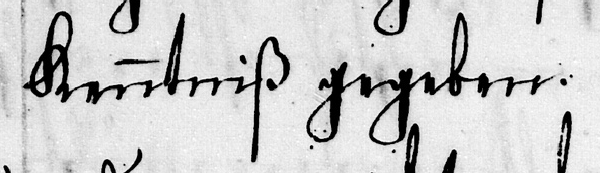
Kenntniß gegeben.
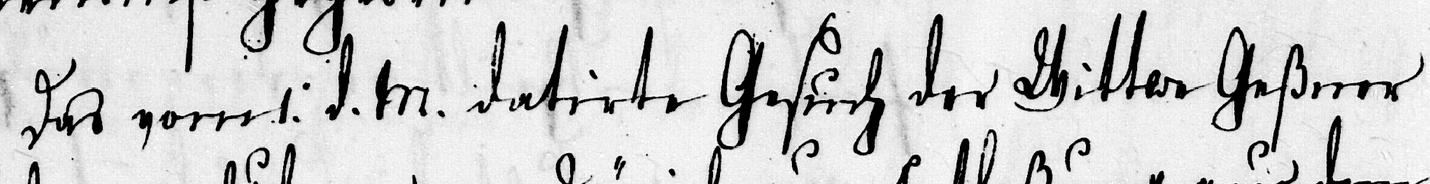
Das vom 1. d. M. datirte Gesuch der Wittwe Geßner
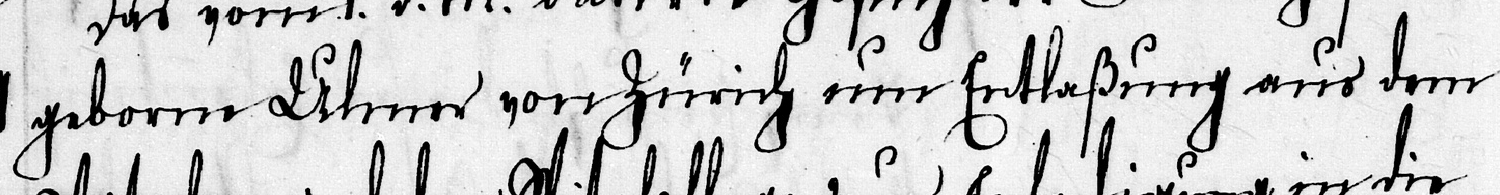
geborne Ulmer von Zürich um Entlaßung aus dem
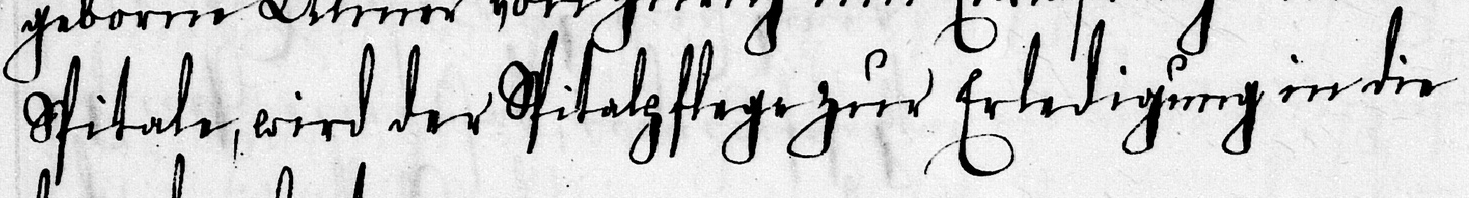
Spitale, wird der Spitalpflege zur Erledigung in die
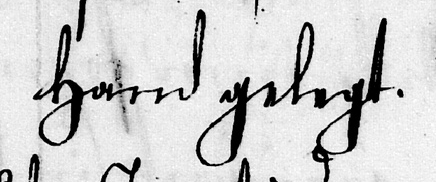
Hand gelegt.
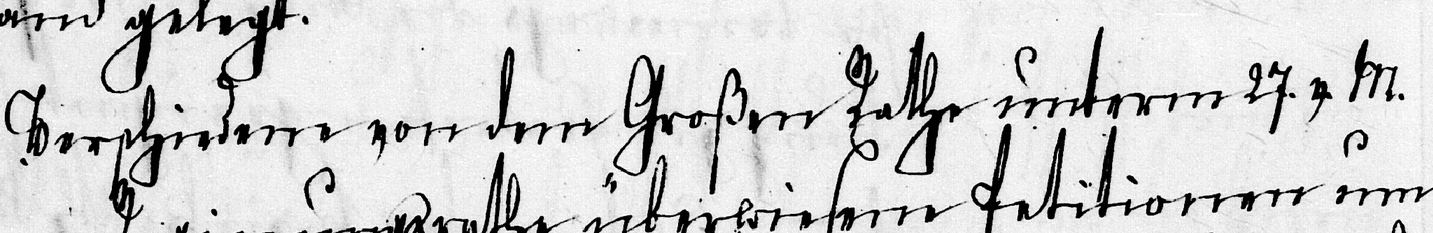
Verschiedene von dem Großen Rathe unterm 27. v. M.
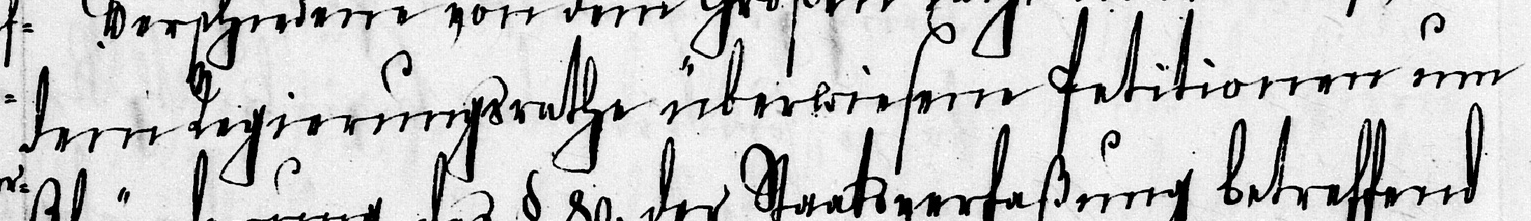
dem Regierungsrathe überwiesene Petitionen um
